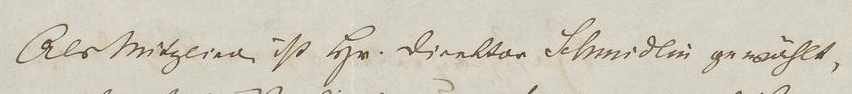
Als Mitglied ist Hr. Direktor Schmidlin gewählt,
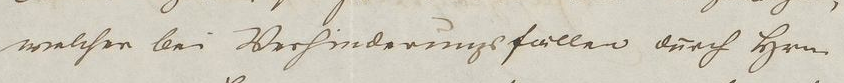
welcher bei Verhinderungsfällen durch Hrn
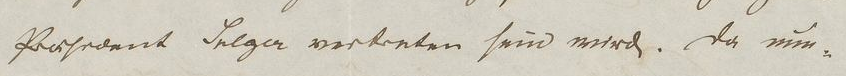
Präsident Sulger vertreten sein wird. Da nun-
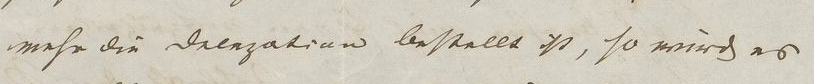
mehr die Delegation bestellt ist, so wird es
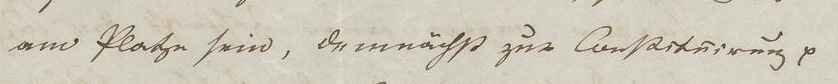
am Platze sein, demnächst zur Constituirung &
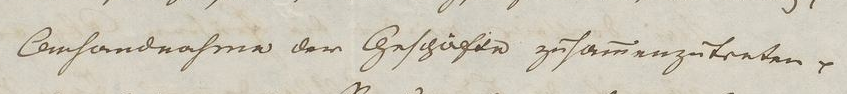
Anhandnahme der Geschäfte zusammenzutreten &
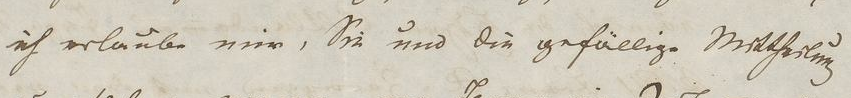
ich erlaube mir, Sie um die gefällige Mittheilung
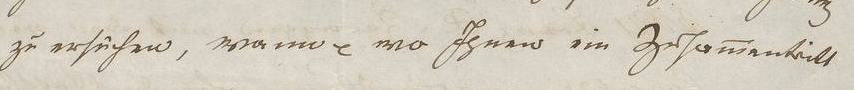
zu ersuchen, wann & wo Ihnen ein Zusammentritt
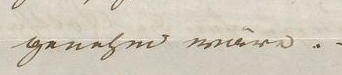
genehm wäre. –
